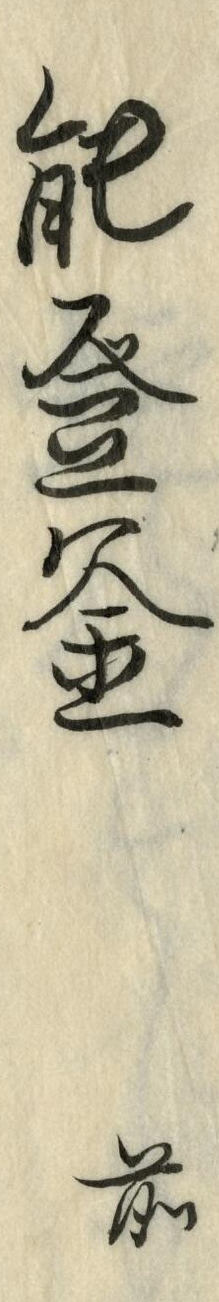能登釜前
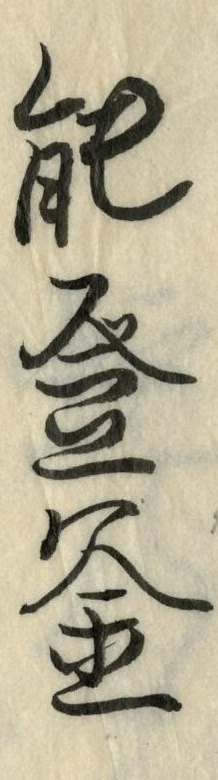能登釜
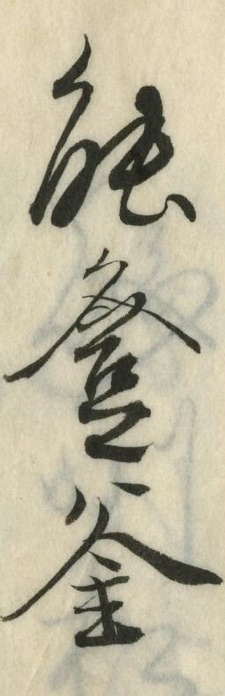能登釜
